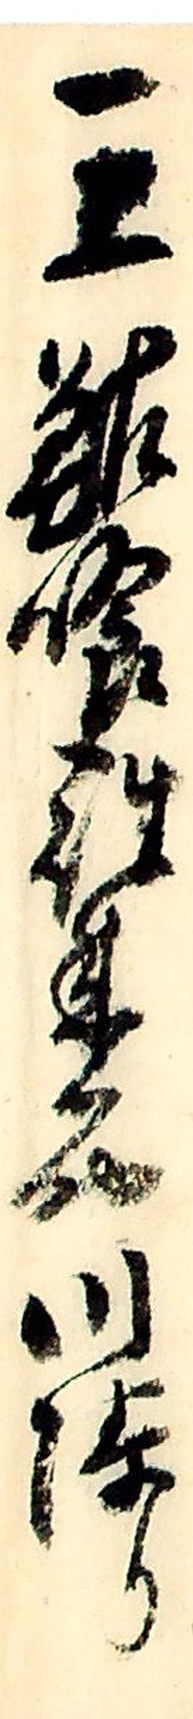一上鮎喰往来筋川渉り
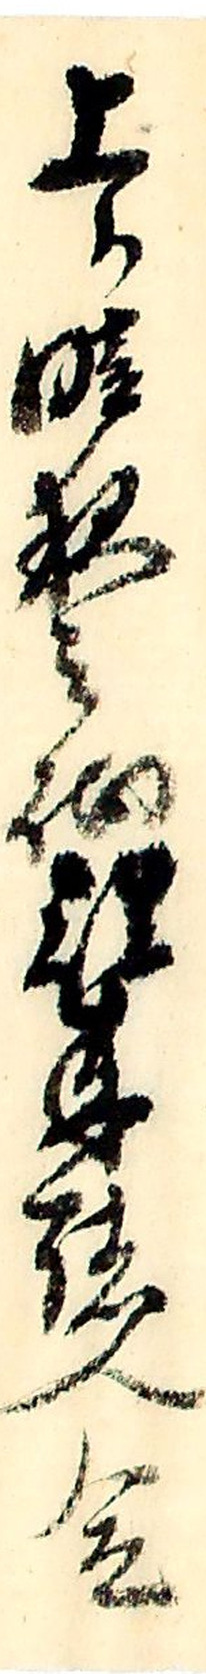上り暗夜之砌往来諸人全
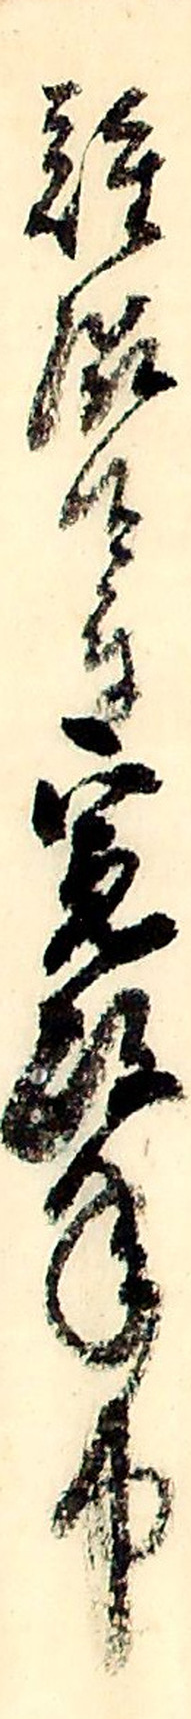難渋候に付寛政年中
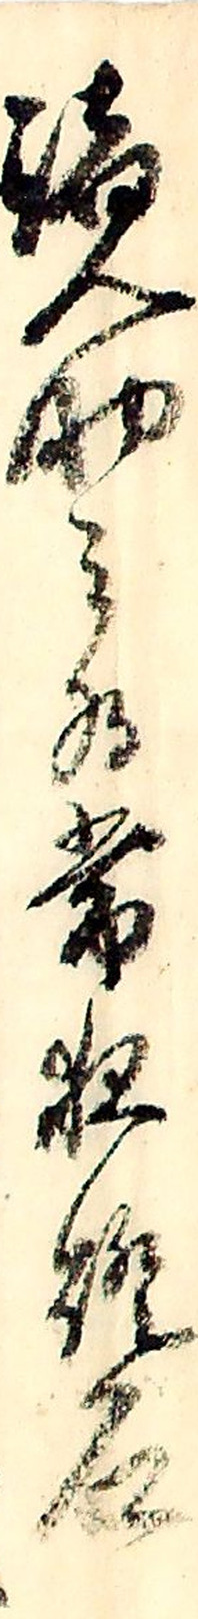諸人助之為常夜灯石
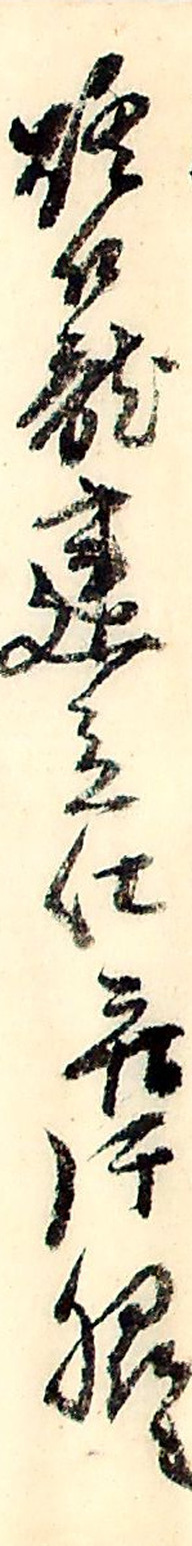灯籠建立仕并片脇に
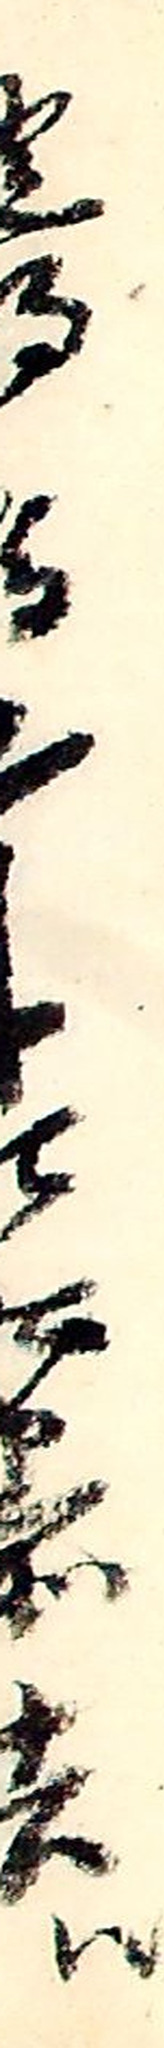灯明庵出来仕居申所去る

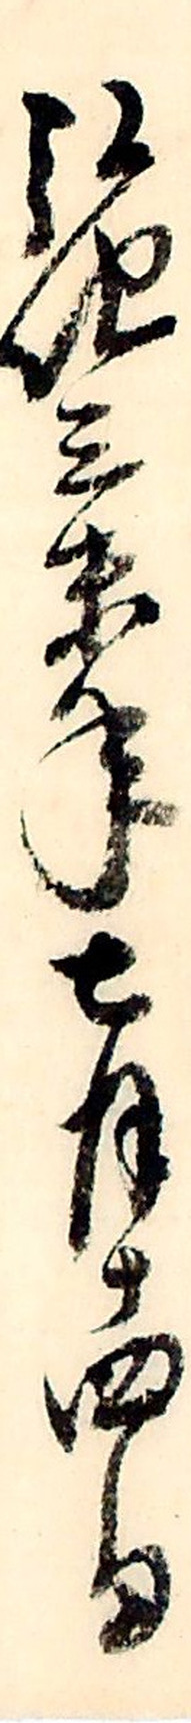弘化三未年七月十四日
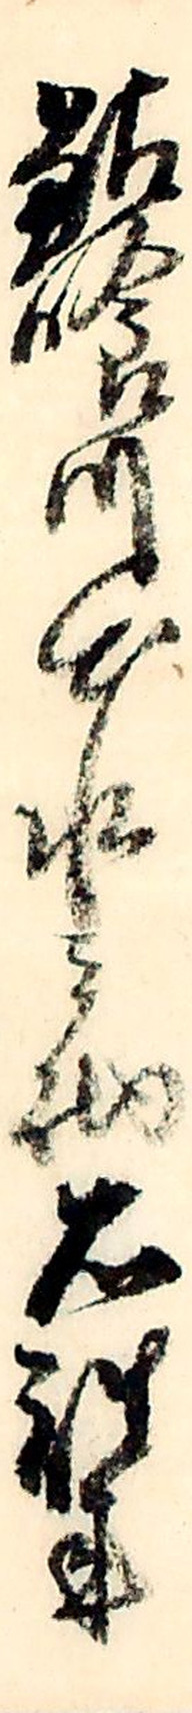鮎喰川出水之砌右往来
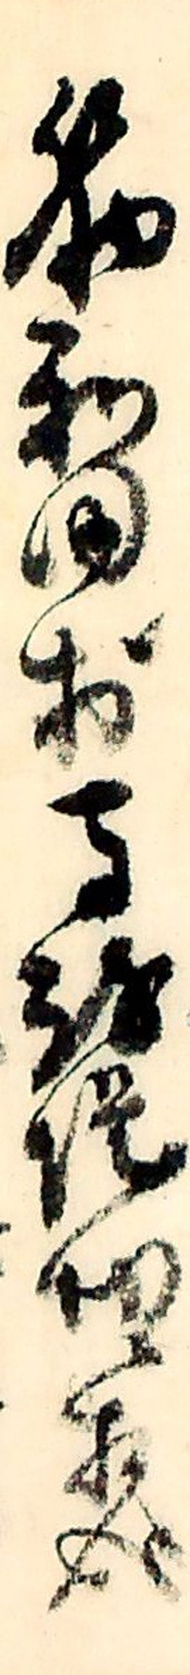筋和田村馬越堤切に相成
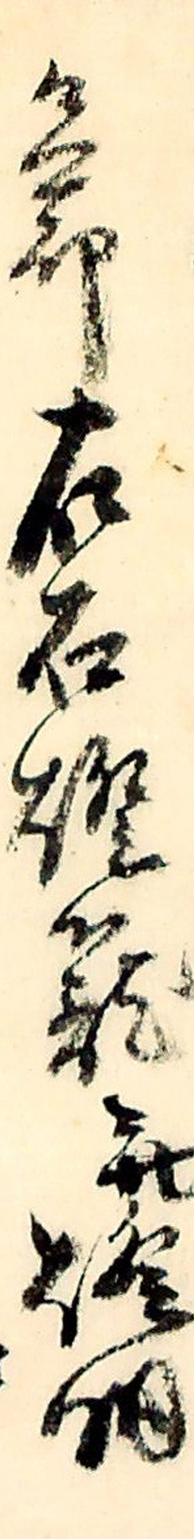候節右石灯籠并灯明
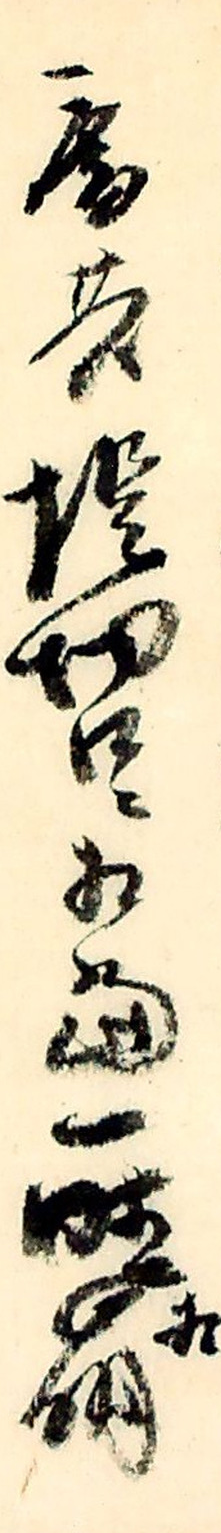庵共堤切口に相当一時に相崩
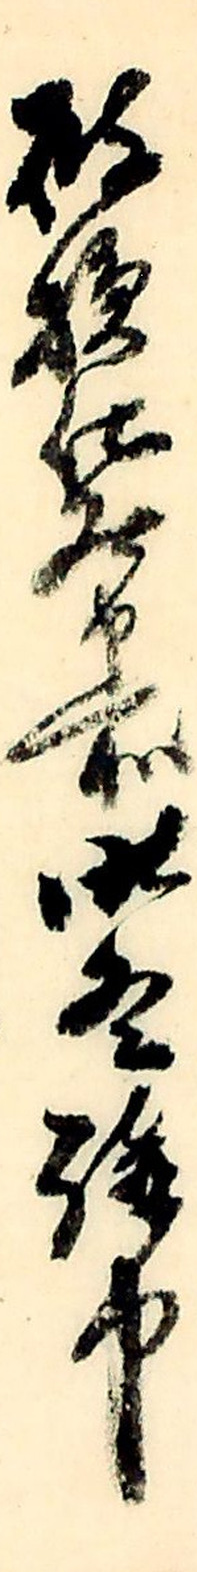破損仕居申所昨冬講中
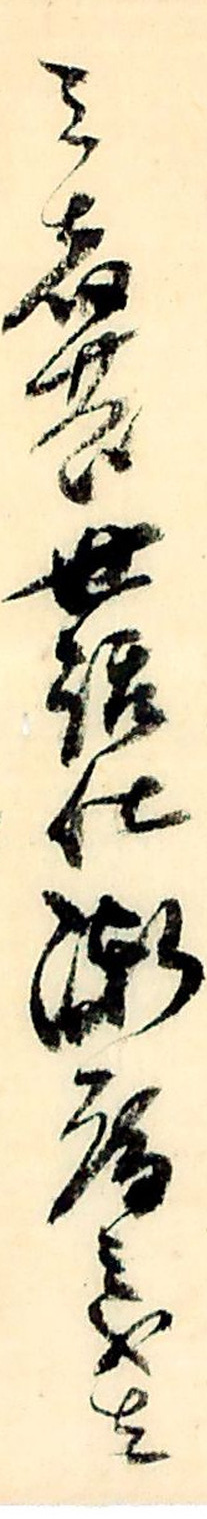之者共世話仕漸庵之義は
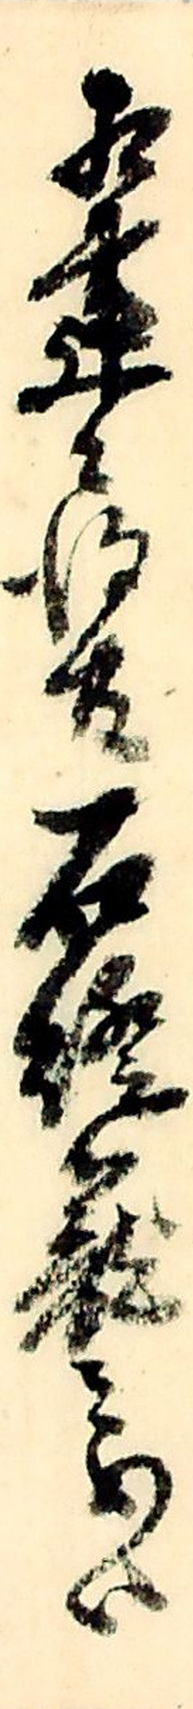相建候得共石灯籠之義は
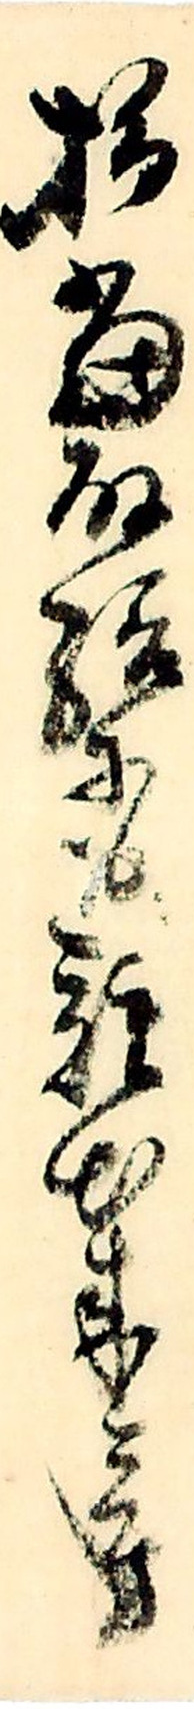指当取繕等も難出来に付
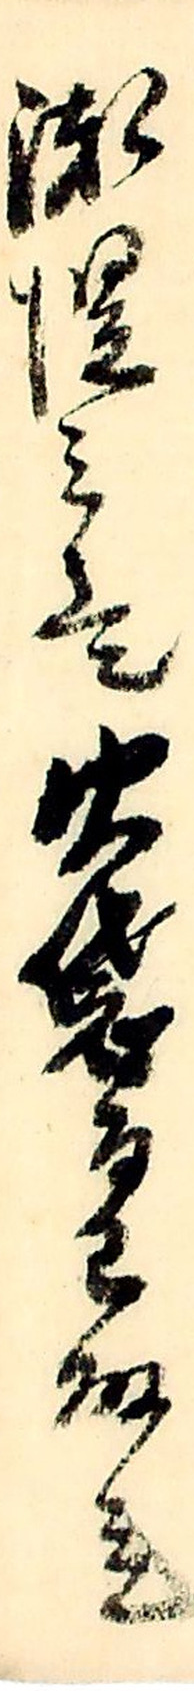漸堤之上に火袋而已取立
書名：和田村操芝居不合書控
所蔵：鳴門教育大学 Naruto University of Education
